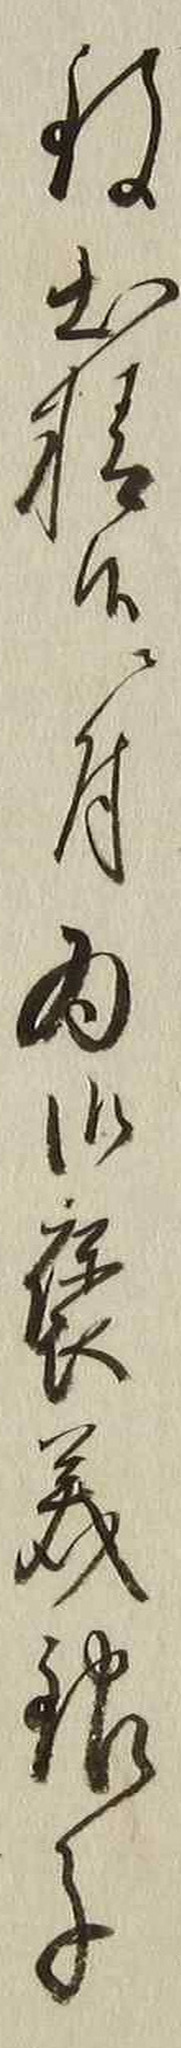致出精候ニ付為御褒美銀子
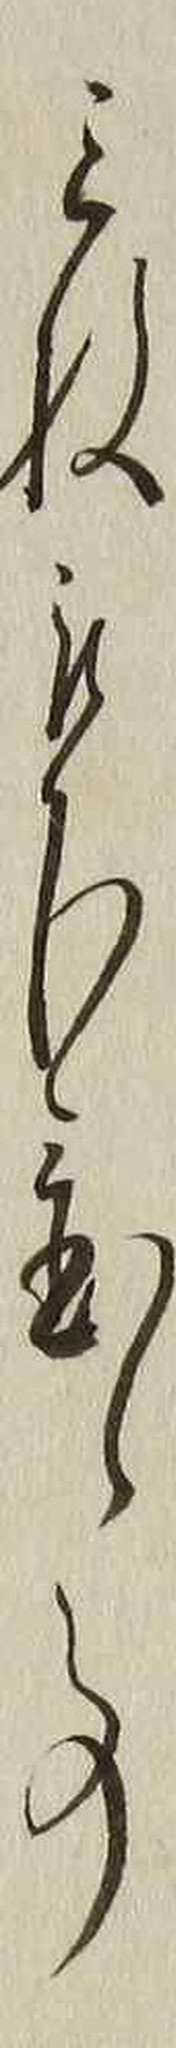三枚被下置候事
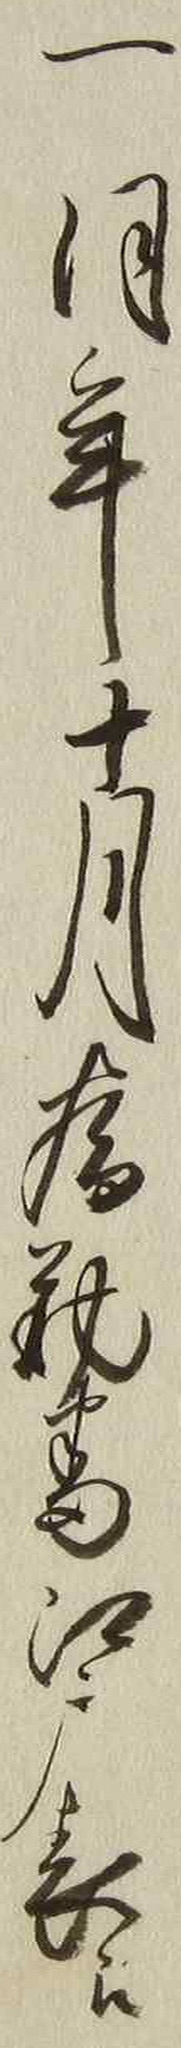一同年十月為勤番江戸表江
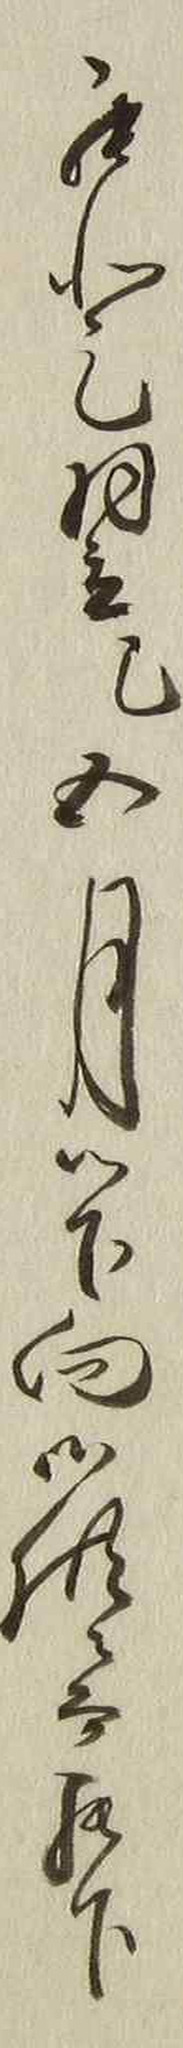罷登翌巳五月御下向御供ニ而罷下
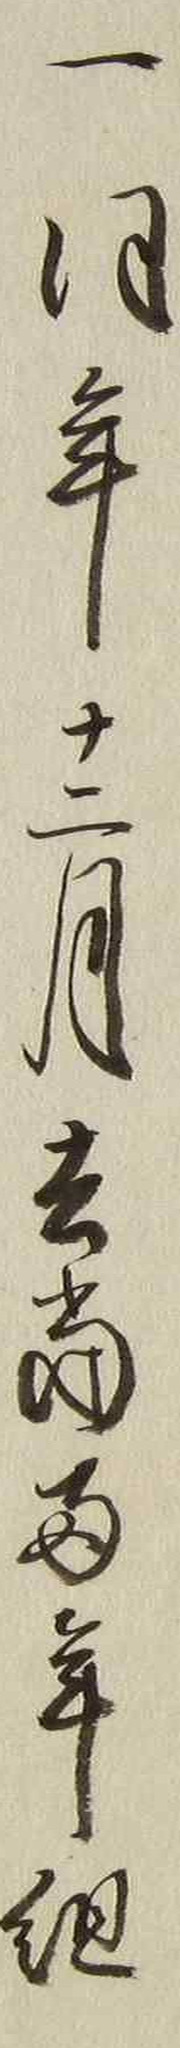一同年十二月去当両年組
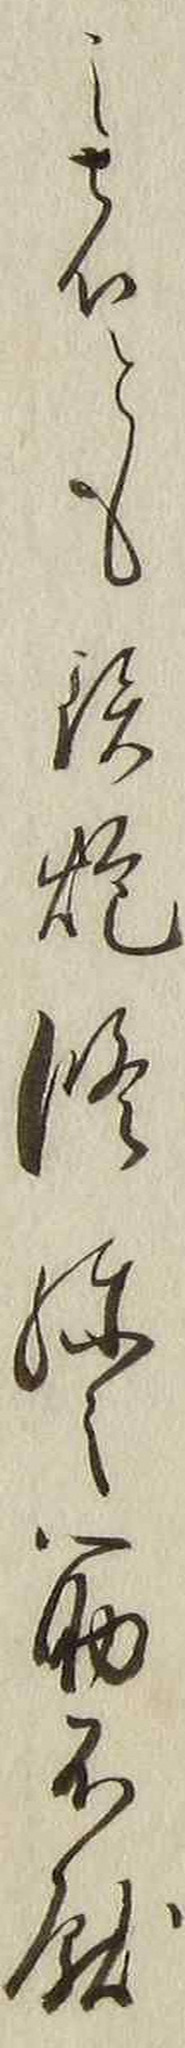之者とも鉄砲修練之筋不厭
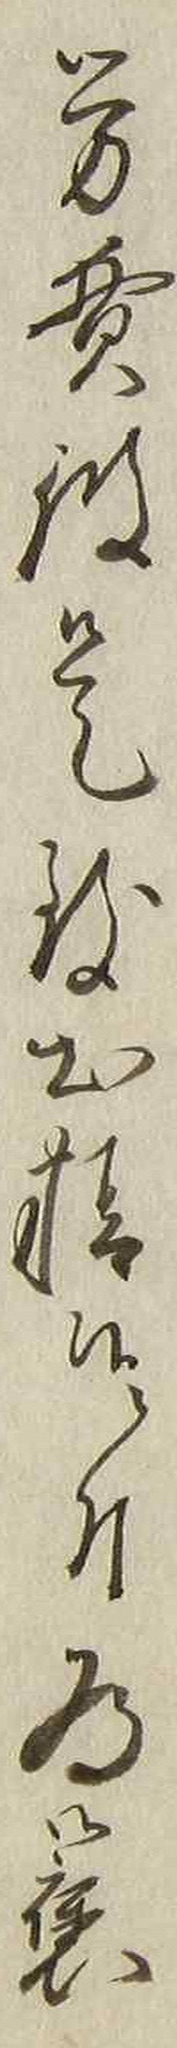労費彼是致出精候ニ付為御褒
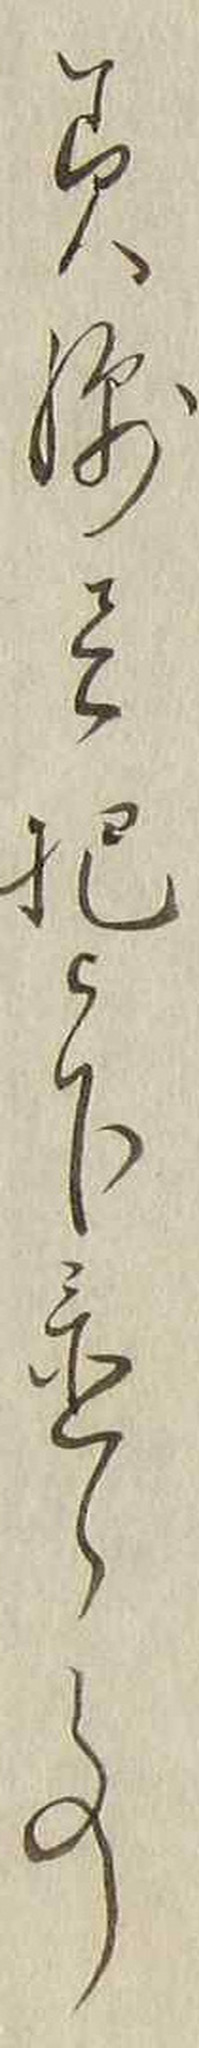美綿壱把被下置候事

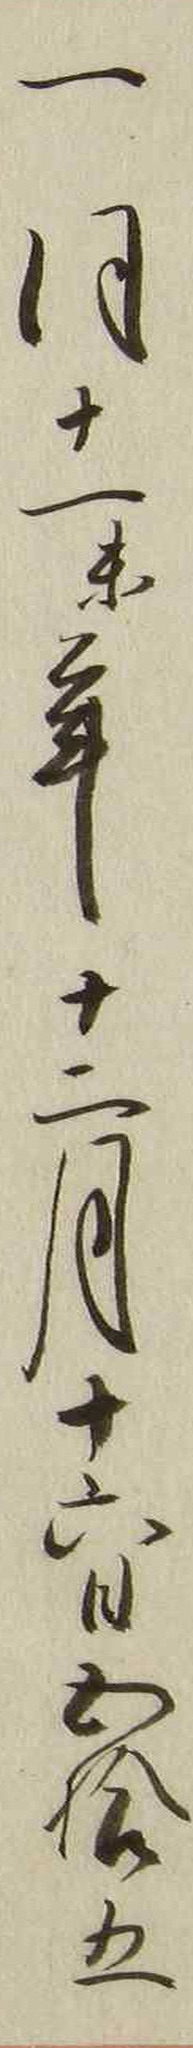一同十一未年十二月十六日五拾五
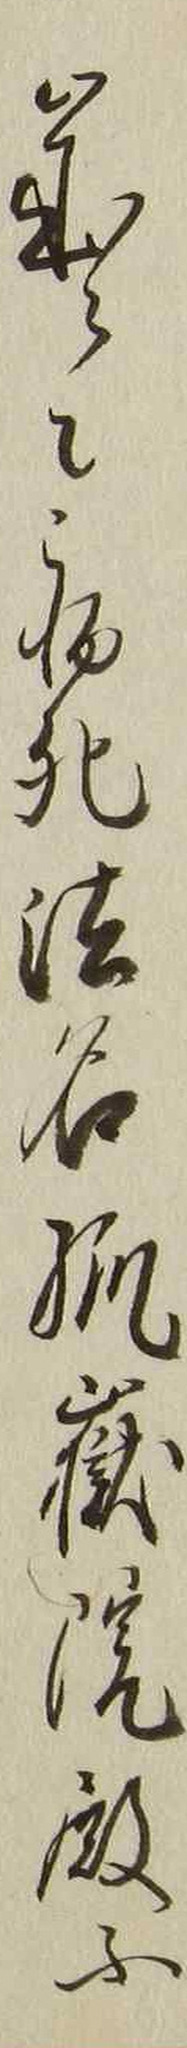歳ニて病死法名孤嶽院殿不
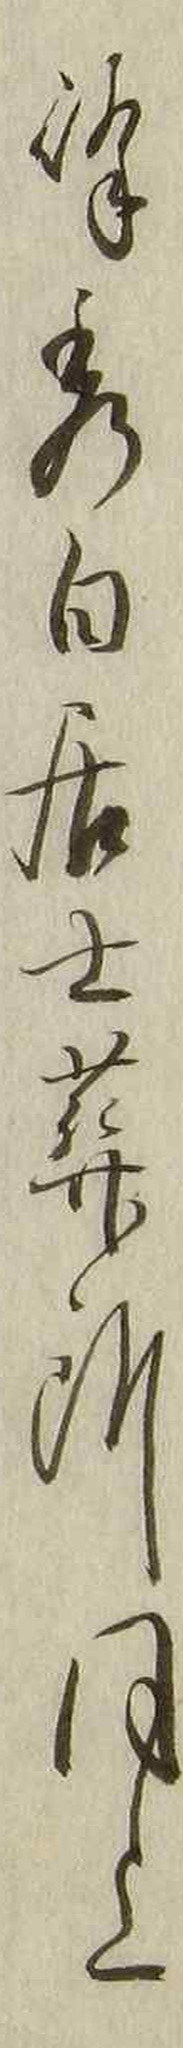峰秀白居士葬所同上
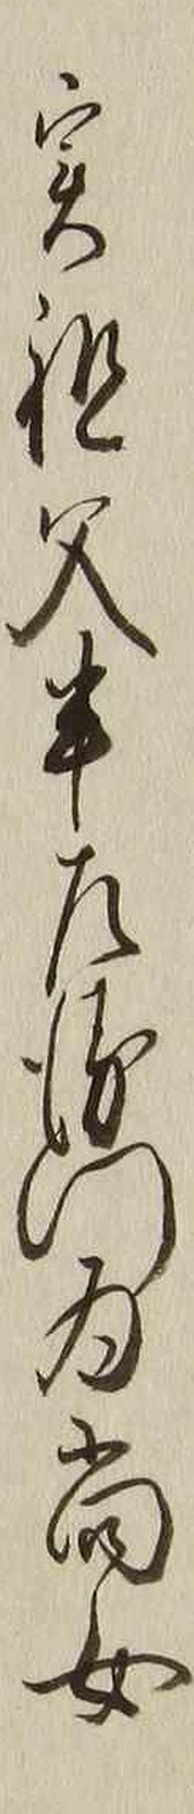実祖父半左衛門為尚女
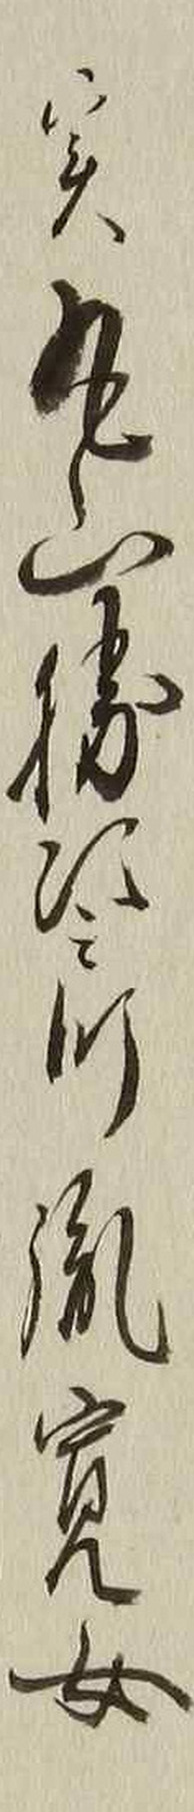実丸山勝次郎胤寛女
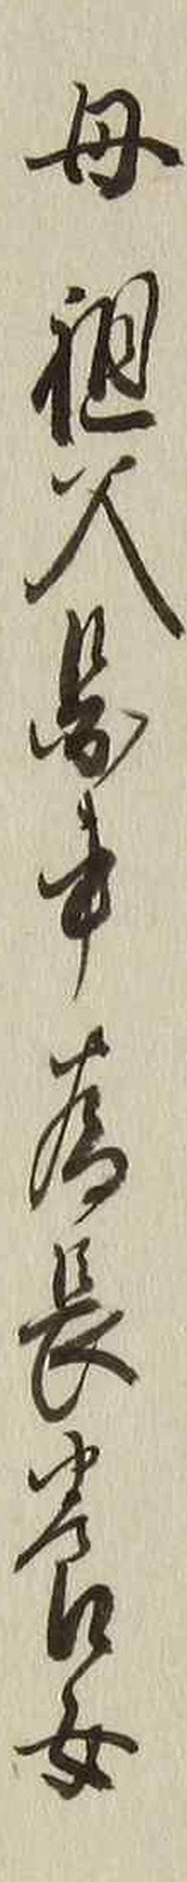母祖父図書為長養女
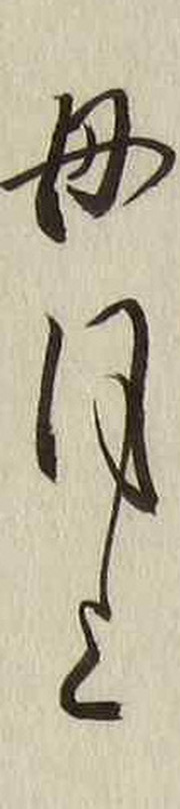母同上

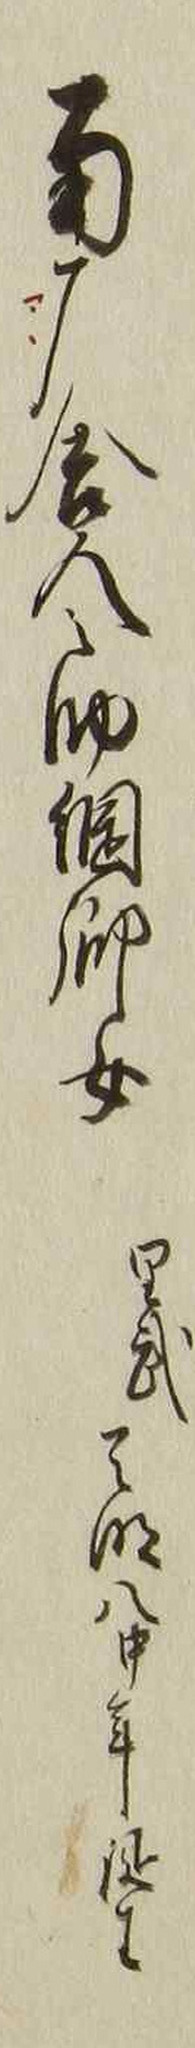南原舎人之助綱郷女里武天明八申年誕生
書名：諸士系譜　巻之18　い之部18
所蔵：会津若松市立会津図書館
